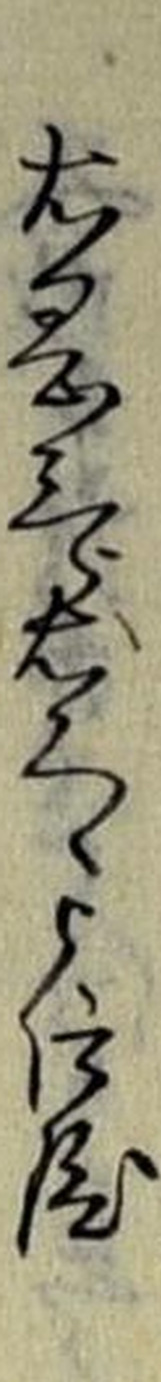右岡三郎右衛門へ被仰渡
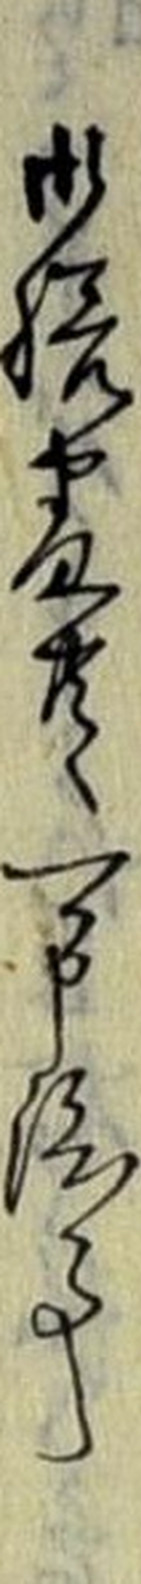御膳番共へ可申渡事
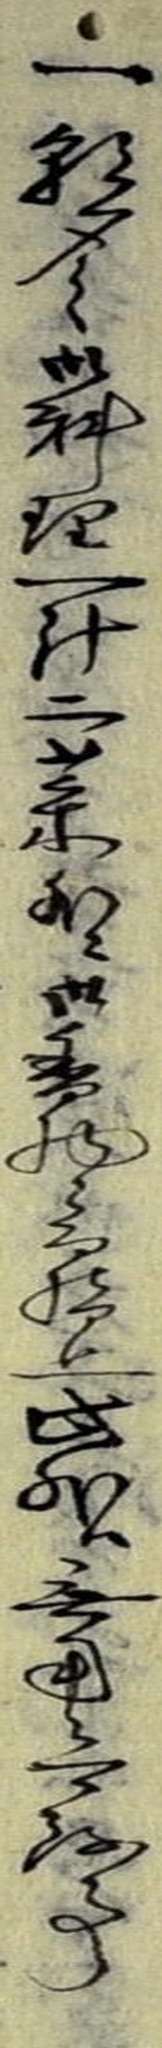一朝夕之御料理一汁二菜外ニ御香物ニ而指上此外ハ無用ニ可致事
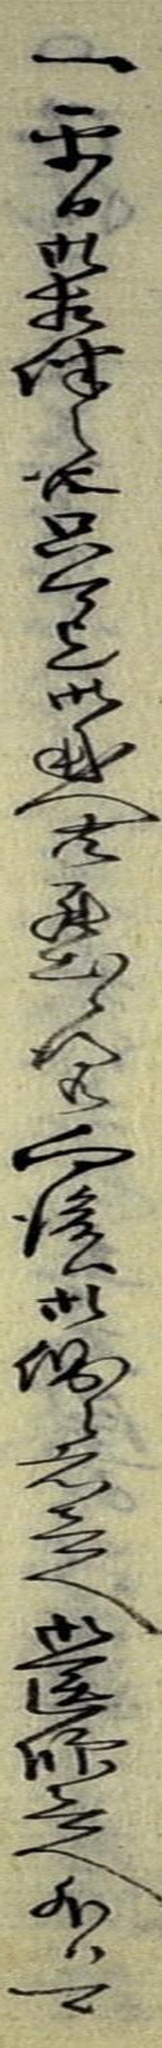一平日御相伴之儀只今迄御用人共罷出候得共向後ハ御側之者壱人御医師壱人外ハ可
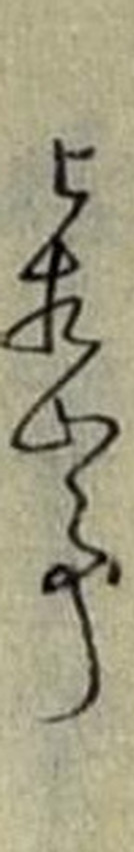被相止事
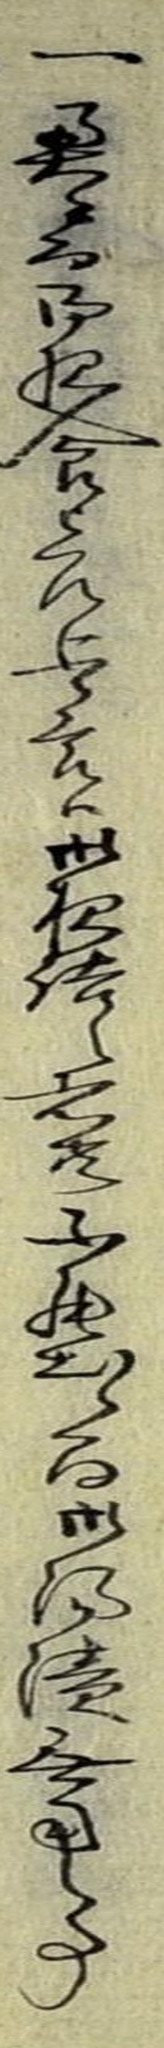一奥ニ而御夜食被召上候節ハ御夜詰之者共不罷出候間御湯漬無用之事
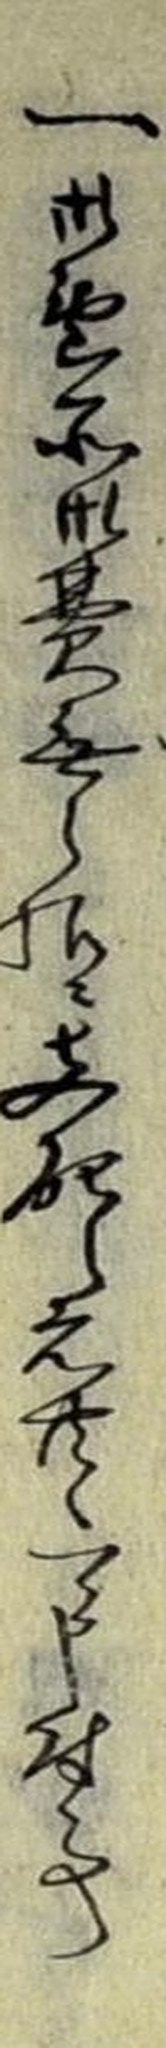一御台所御費無之様ニ支配之者共へ可申付事
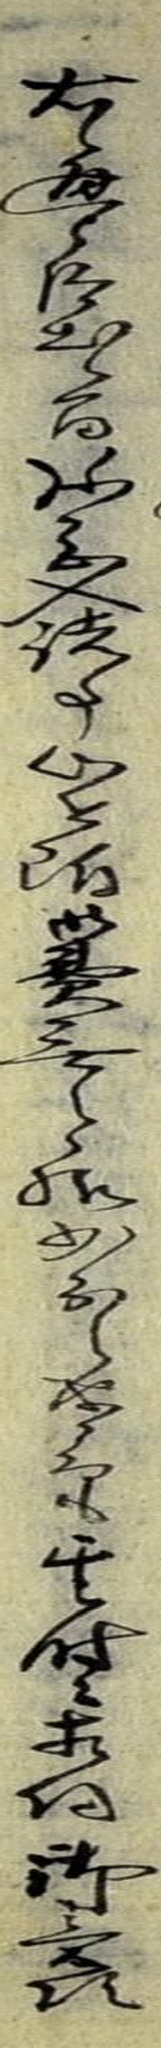右之通被仰出候間弥念入諸事心を付御費無之候様少分之儀ニ而も其時々相伺御意次
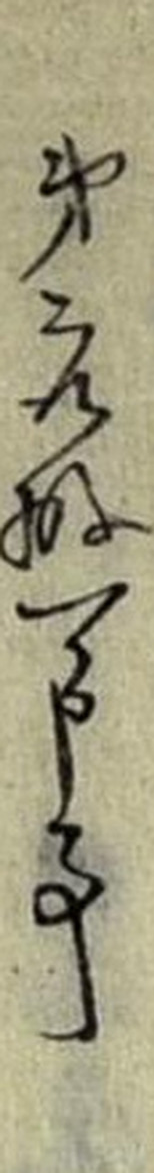第取扱可申事
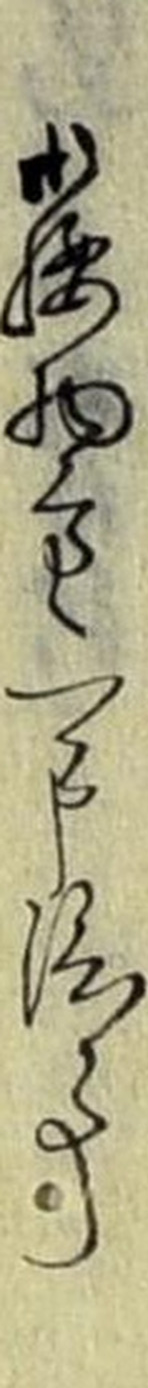御腰物方へ可申渡事
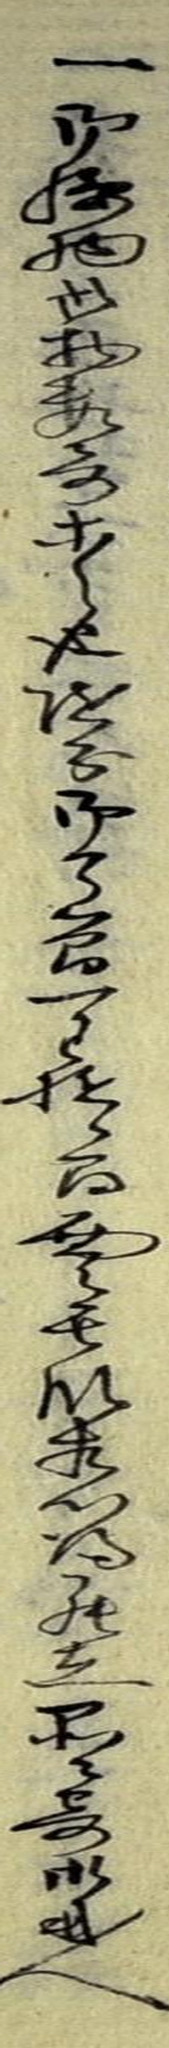一御腰物御物数奇唐等之儀随分御了簡可被遊候間面々其段相心得罷在品ニ寄御用人
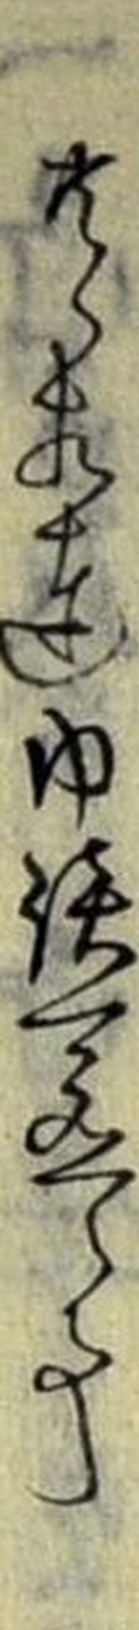共へ相達申談可有之事
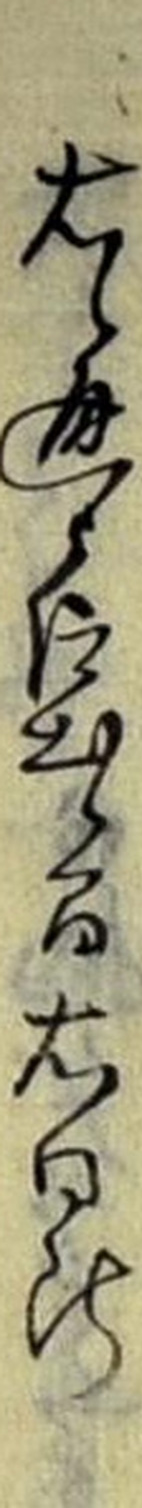右之通被仰出候間右同断

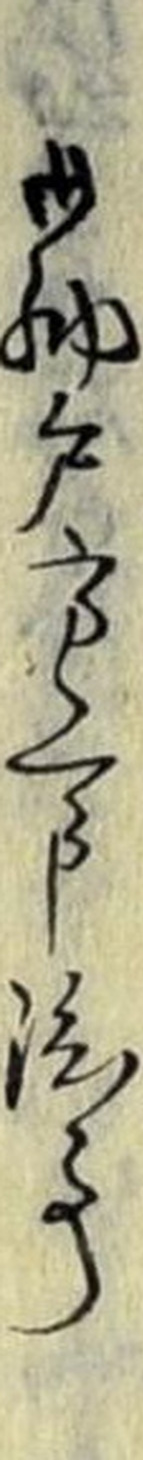御納戸方へ可申渡事
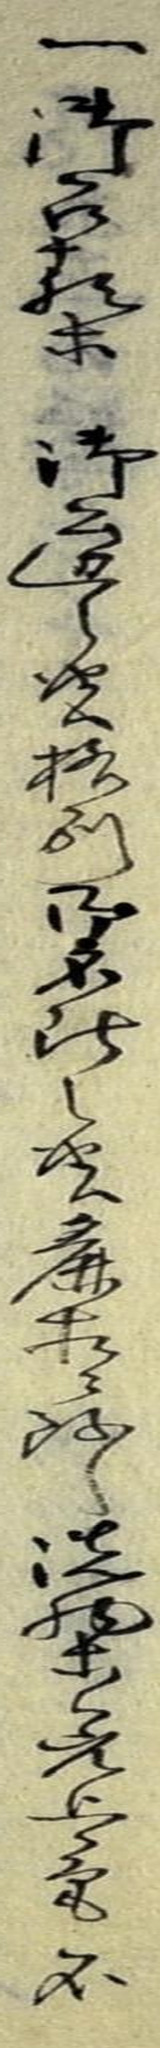一御召類等御公辺之儀ハ格別御不断之儀ハ麁相ニ致し洗物等差上候而も不
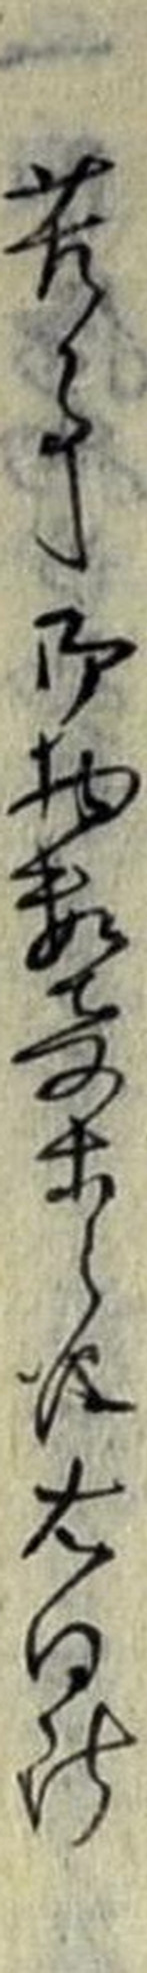苦事御物数奇等之儀右同断
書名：命令之部 一
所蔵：福井県文書館 Fukui Prefectural Archives
